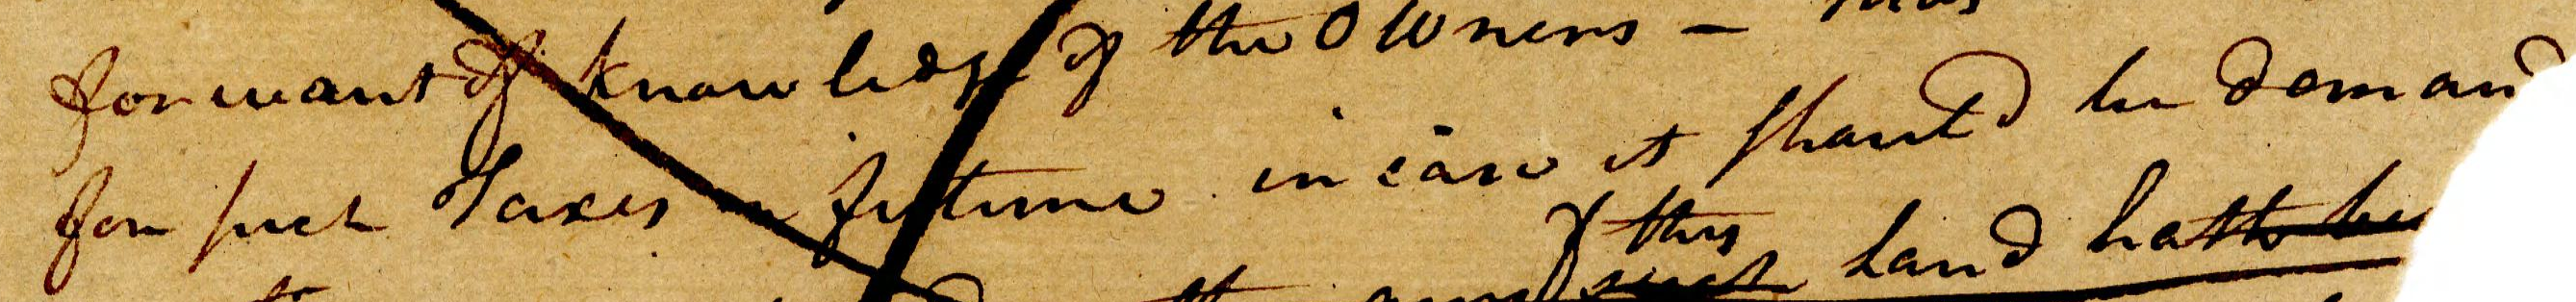for such Taxes in future in case it should be demand
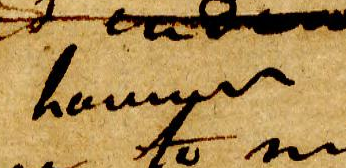Lawyer
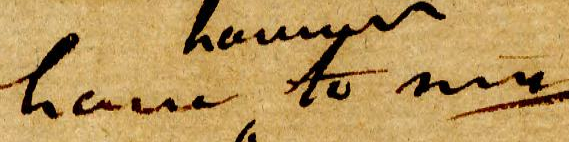have & to me
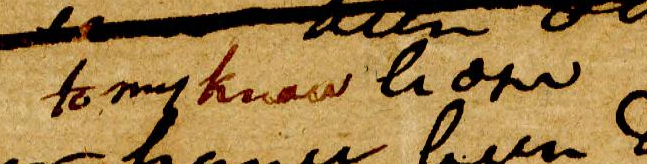to my knowledge
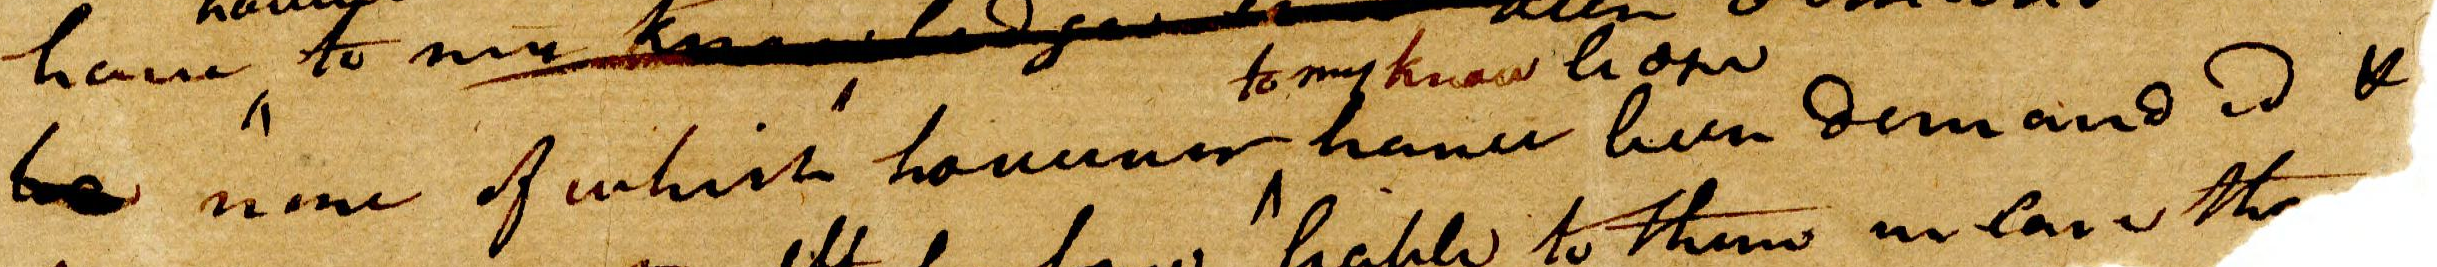[be] none of which ^ havee been demanded &
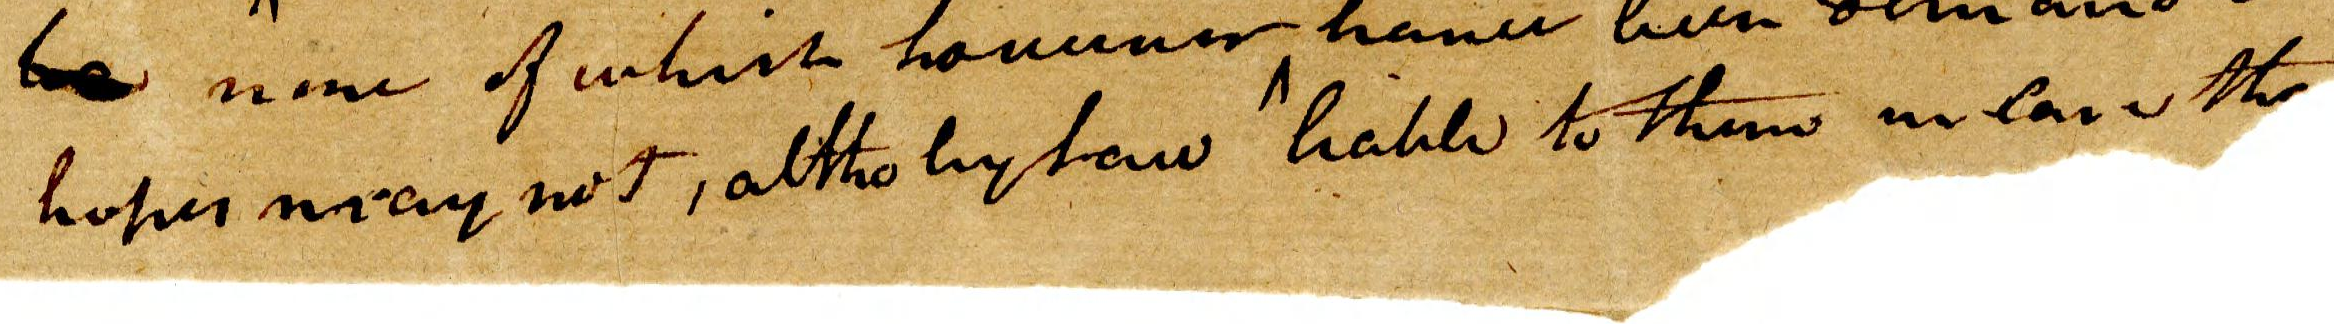hopes may not, altho by Law liable to them in case the
